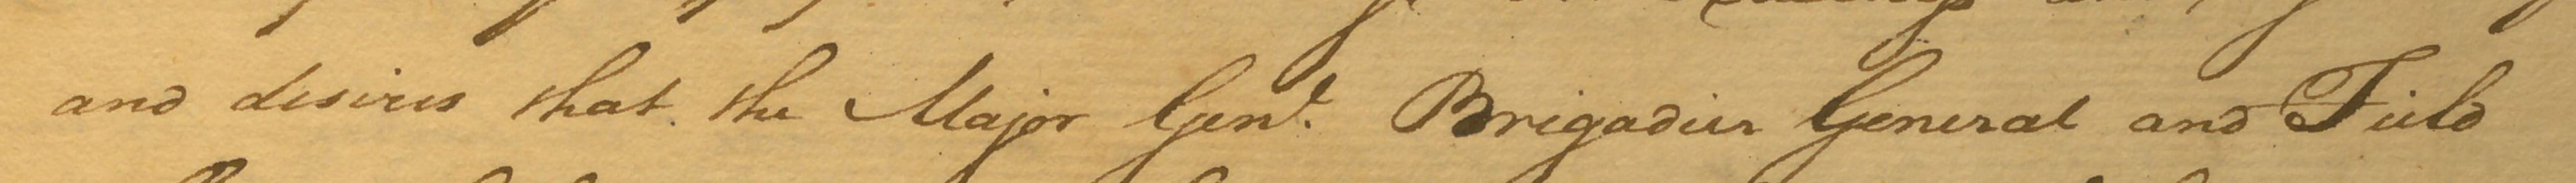and desires that the Major Gen^l. Brigadier General and Field
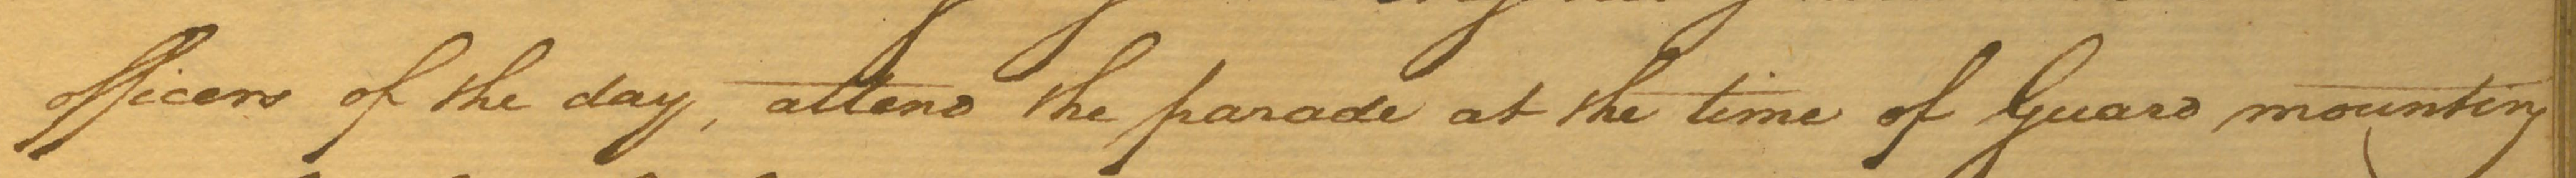officers of the day attend the parade at the time of Guard mounting
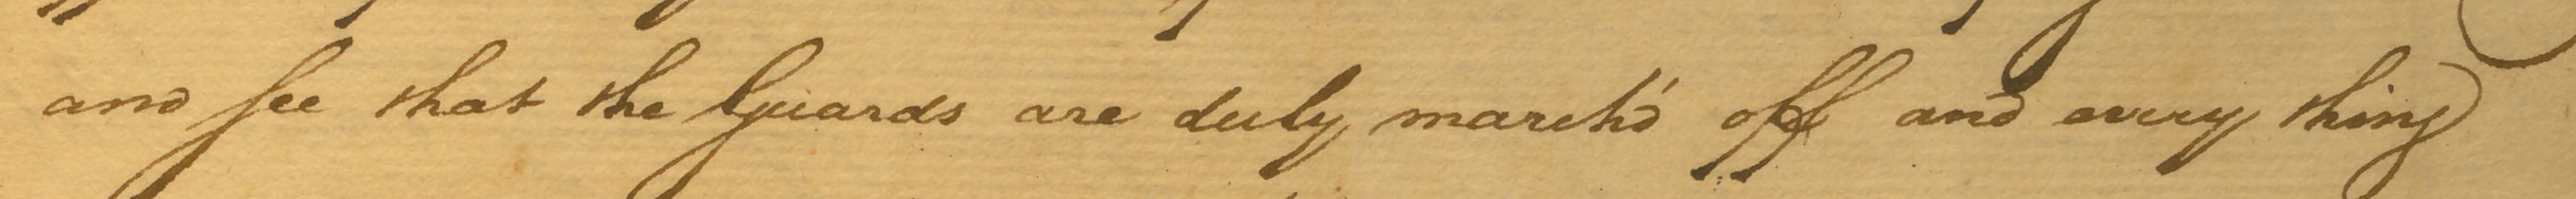and see that the Guards are duly march'd off and every thing
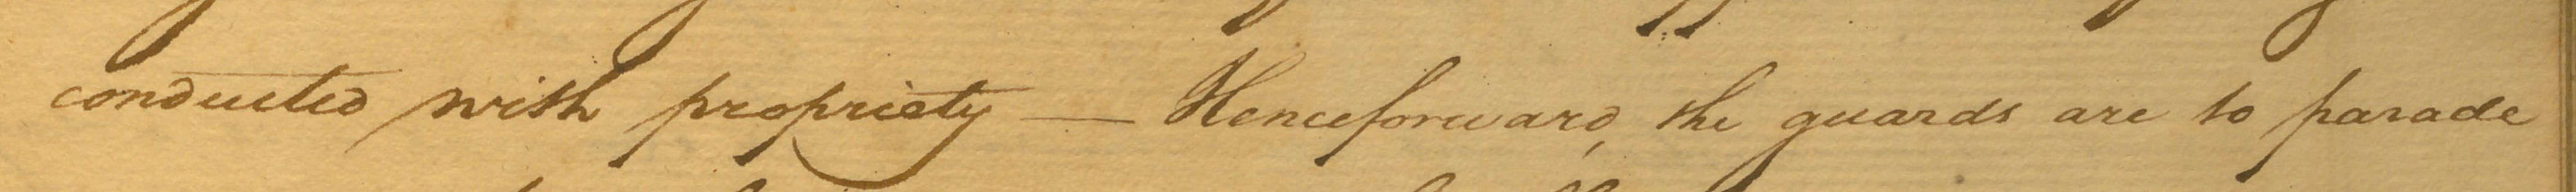conducted with propriety- Henceforward, the guards are to parade
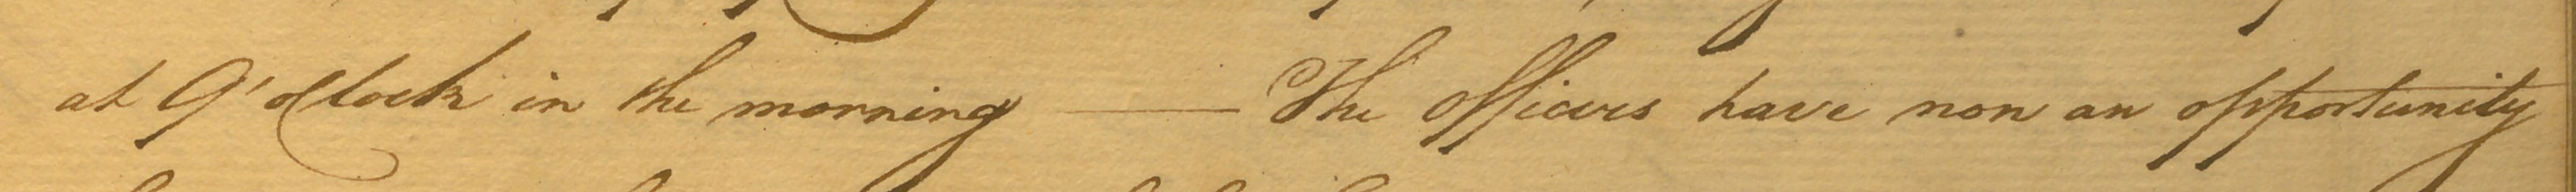at 9 'oClock in the morning- The officers have now an opportunity
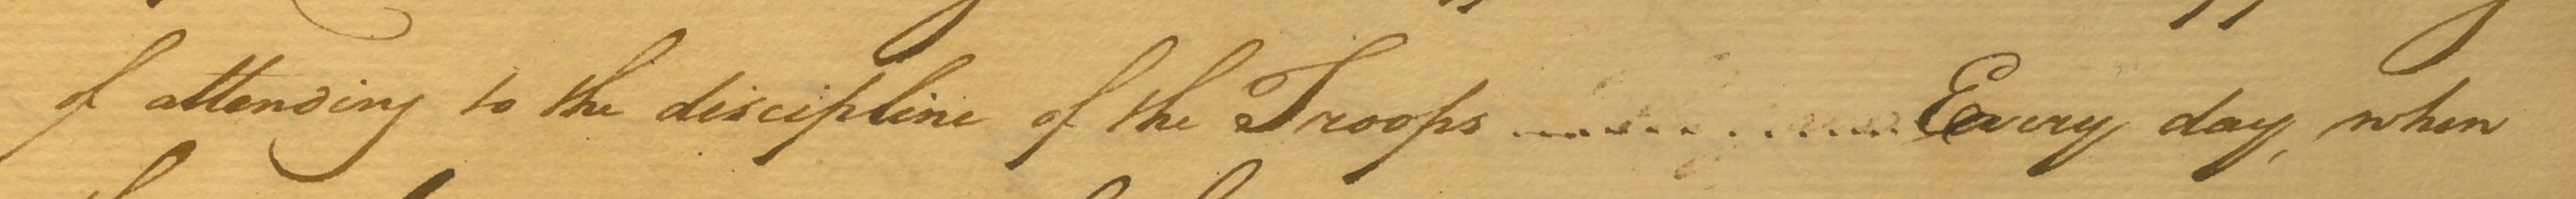of attending to the discipline of the Troops. ........... Every day, when
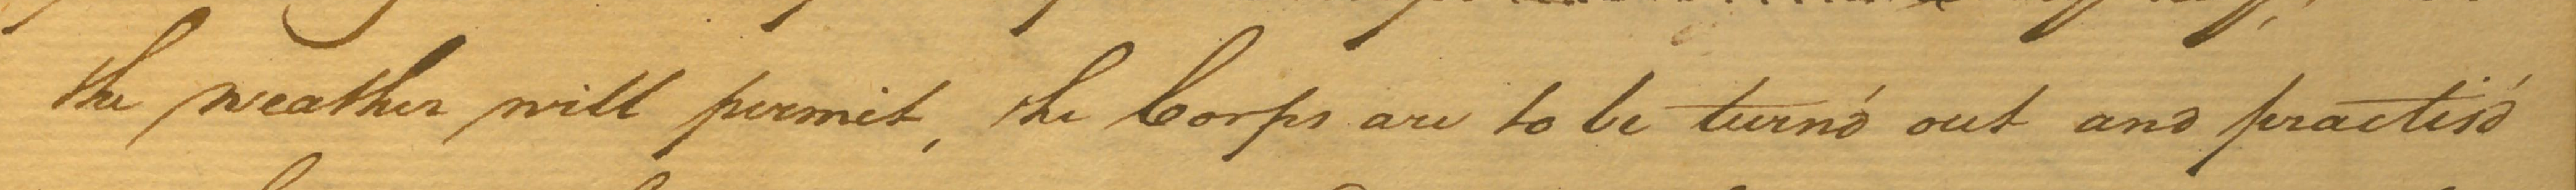the weather will permit, the Corps are to be turn'd out and practis'd
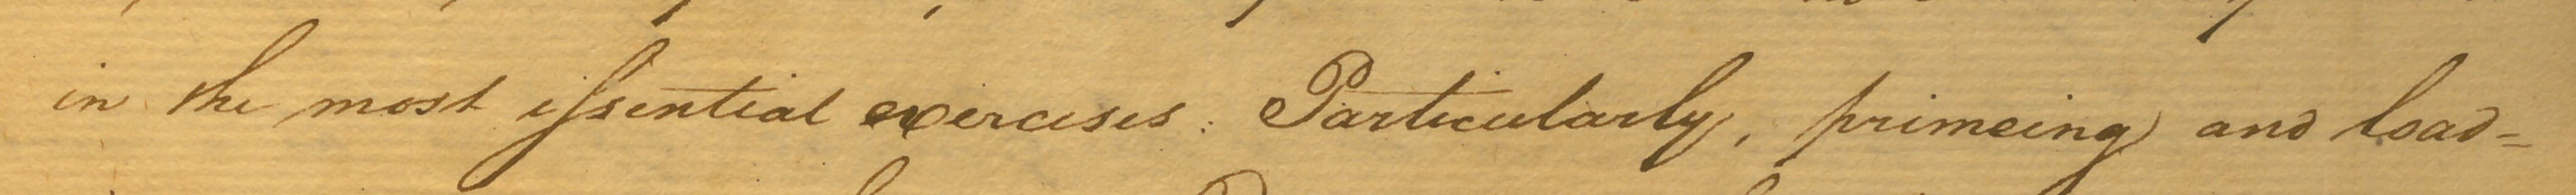in the most essential exercises: Particularly, primeing and load-
